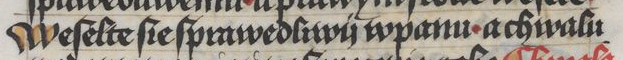Weſelte ſie ſprawedliwij wpanu.a chwalu
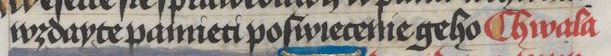wzdayte pamieti poſwiecenie geho.Chwala
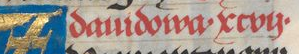davidowa.xcvij.
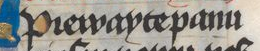Piewayte panu
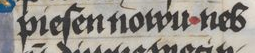pieſen nowu.neb
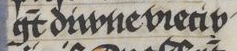ḡt diwne vieci v¬
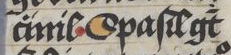ċinil.Spaſil ḡt
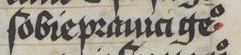ſobie prauici geo
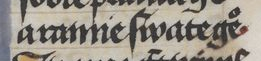a ramie ſwate ge°
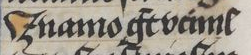Znamo ḡt vċinil
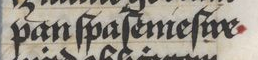pan ſpaſenie ſwe.
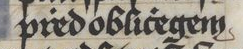pṙed obliċegem
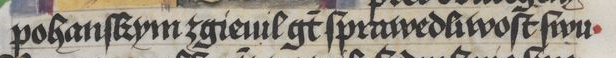pohanſkym zgieuil ḡt ſprawedliwoſt ſwu.
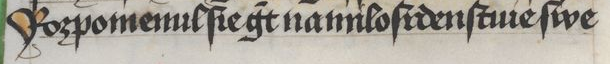Rozpomenul ſie ḡt na miloſrdenſtuie ſwe
